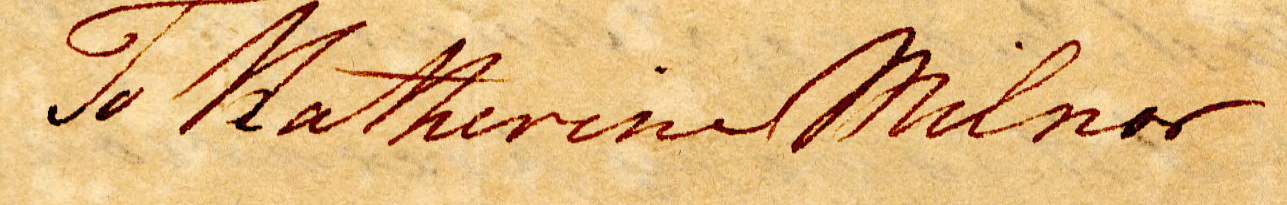To Katherine Milnor
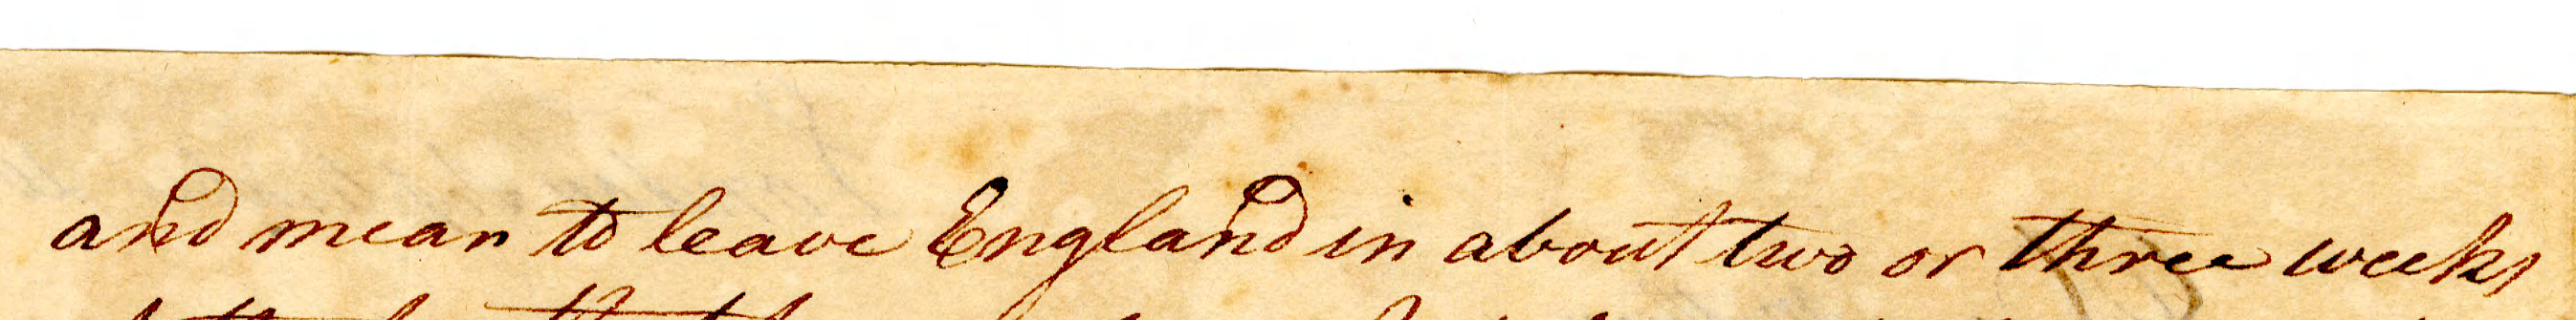and mean to leave England in about two or three weeks
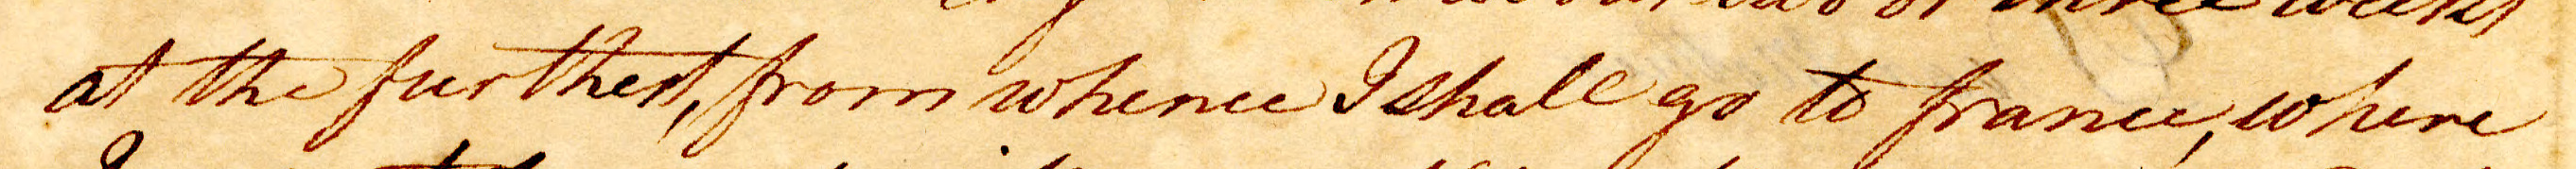at the furthest, from whence I shall go to france, where
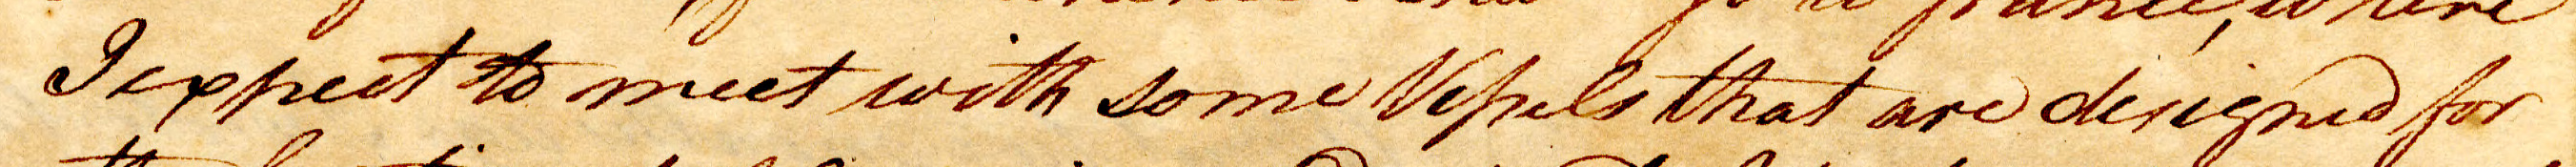I expect to meet with some Vessels that are designed for
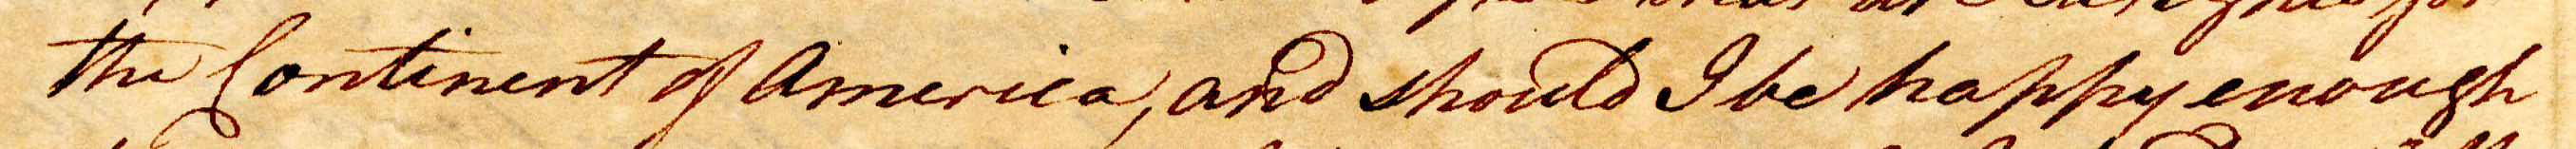the Continent of America, and should I be happy enough
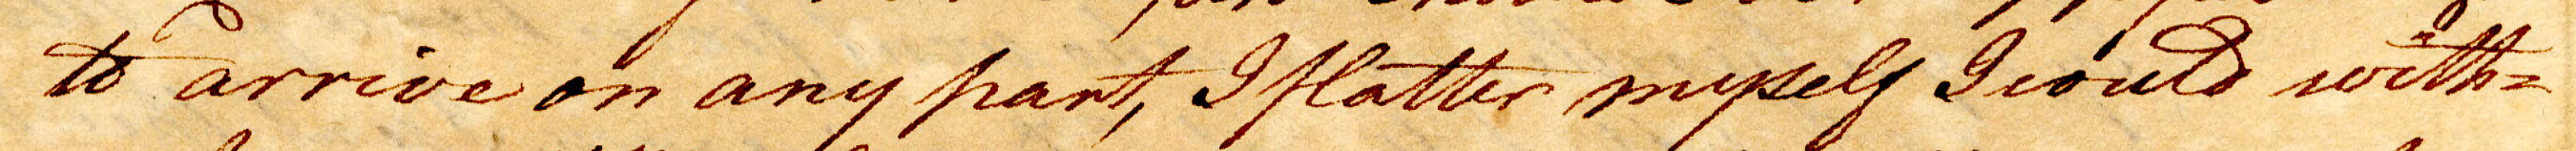to arrive on any part, I flatter myself I could with-
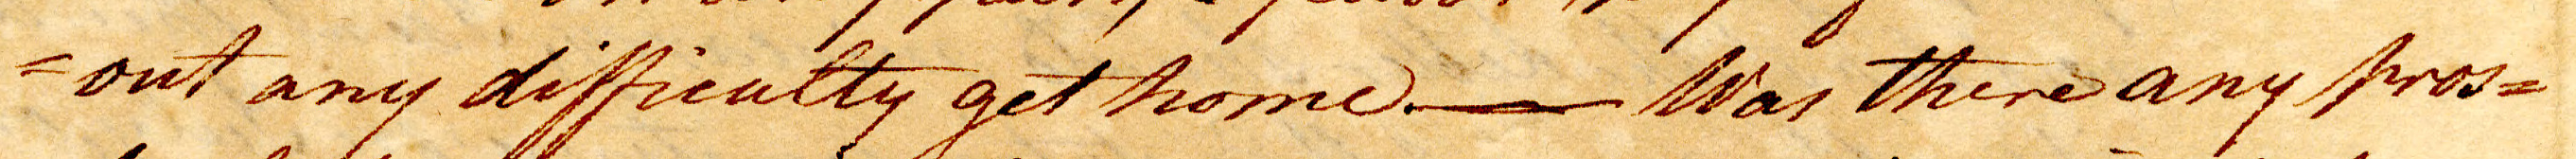-out any difficulty get home.- Was there any pros-
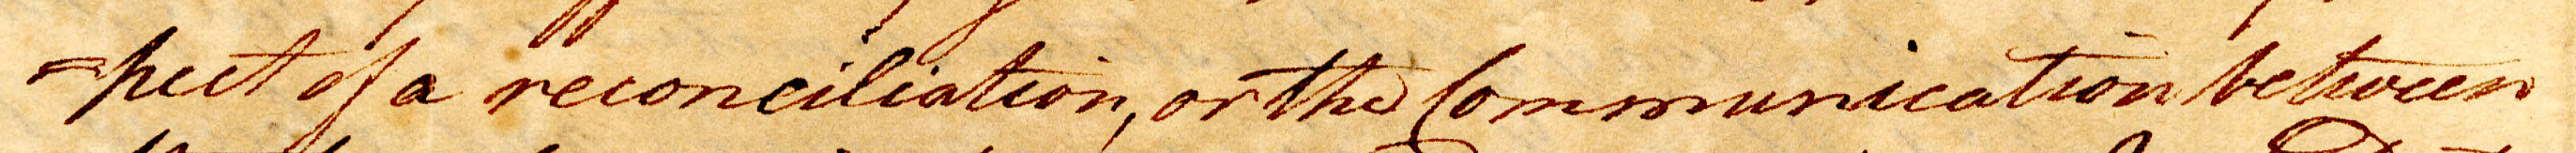-pect of a reconciliation, or the Communication between
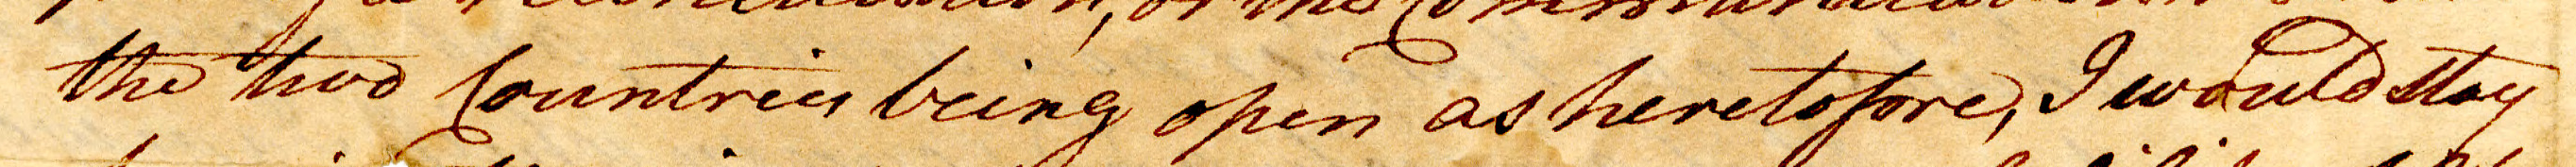the two Countries being open as heretofore, I would stay
